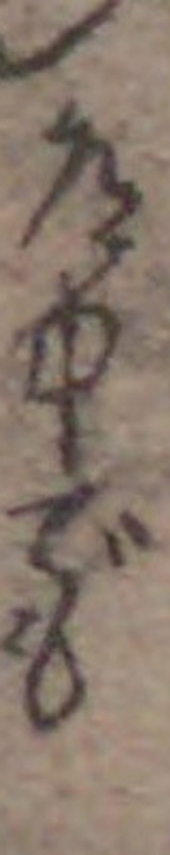道中でも
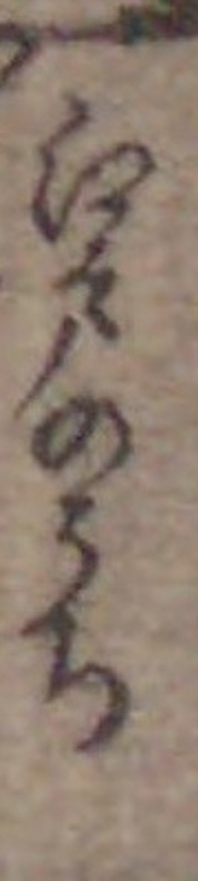江戸のうち
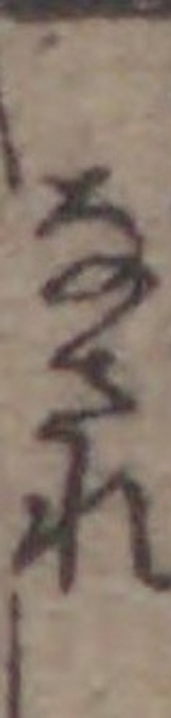なされ
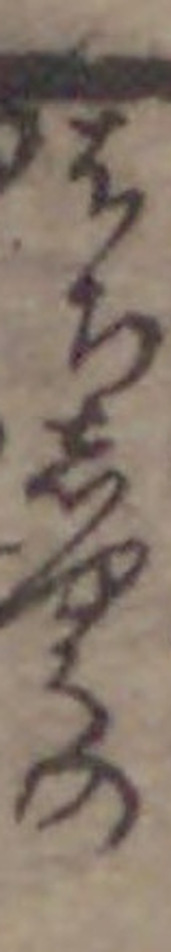はちしやうの
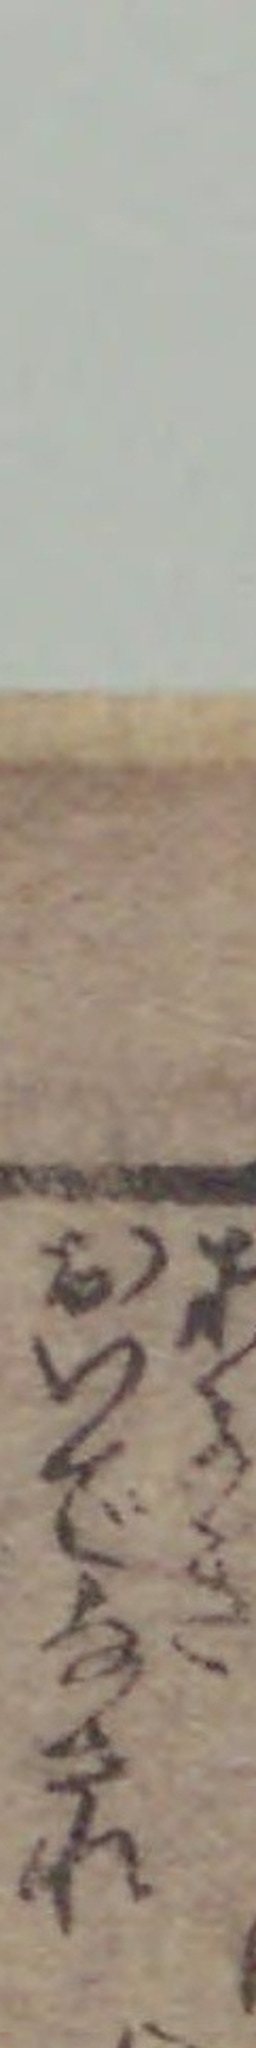おいでなされ
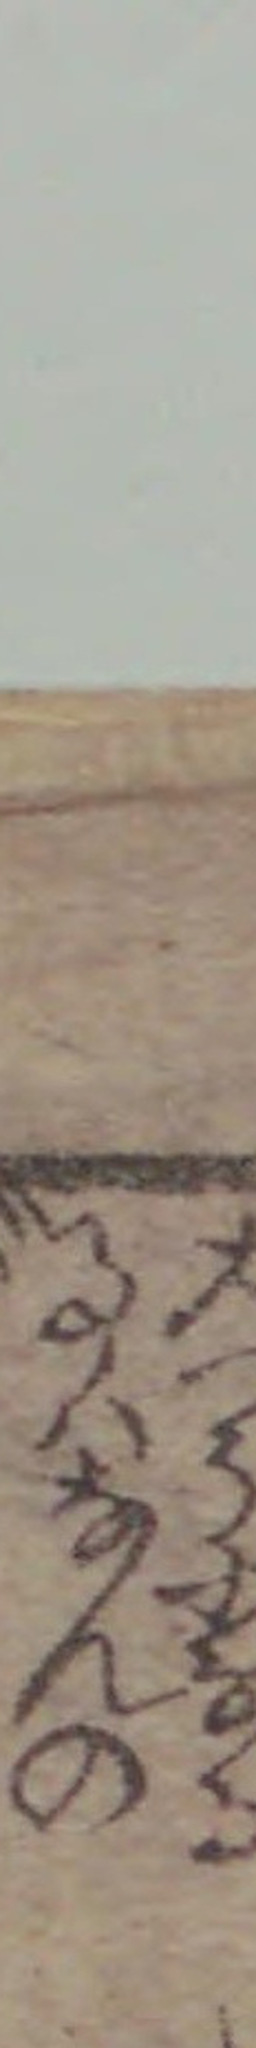事はなんの
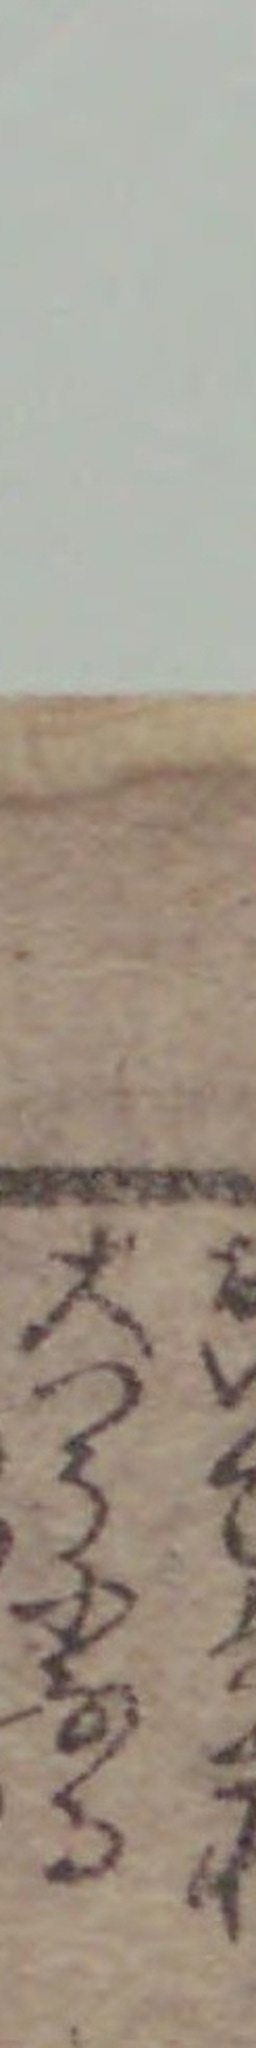大つうになる
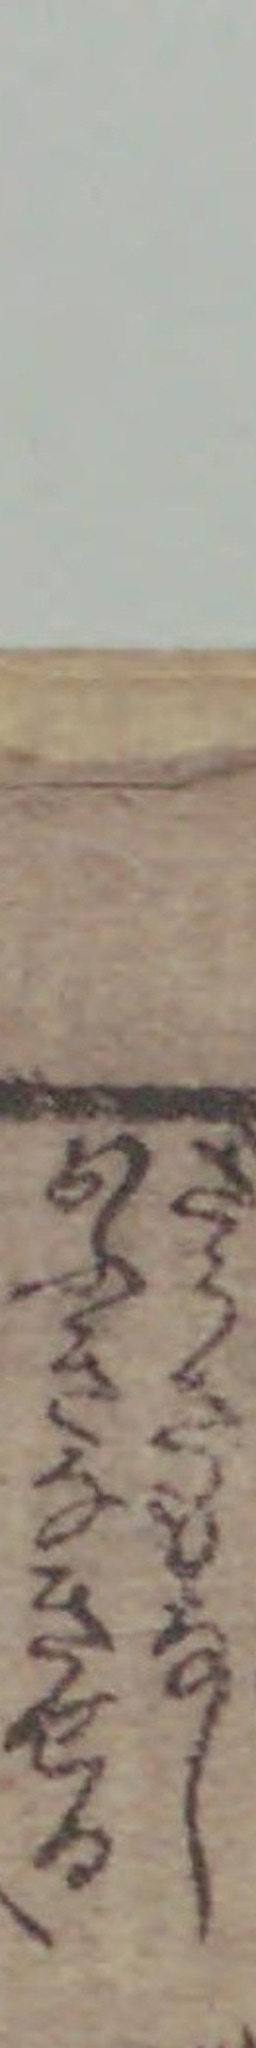おふきなきせる
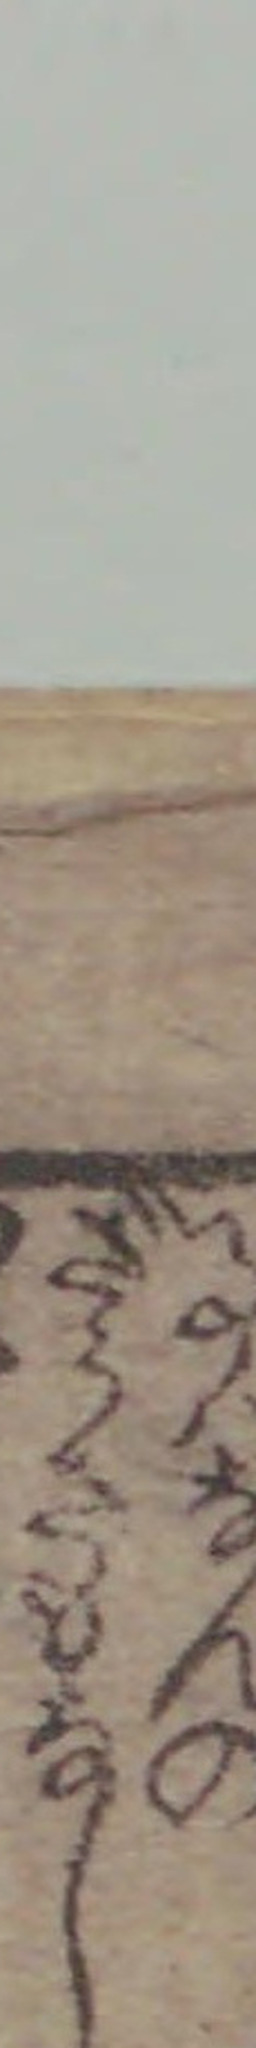ざうさもなし
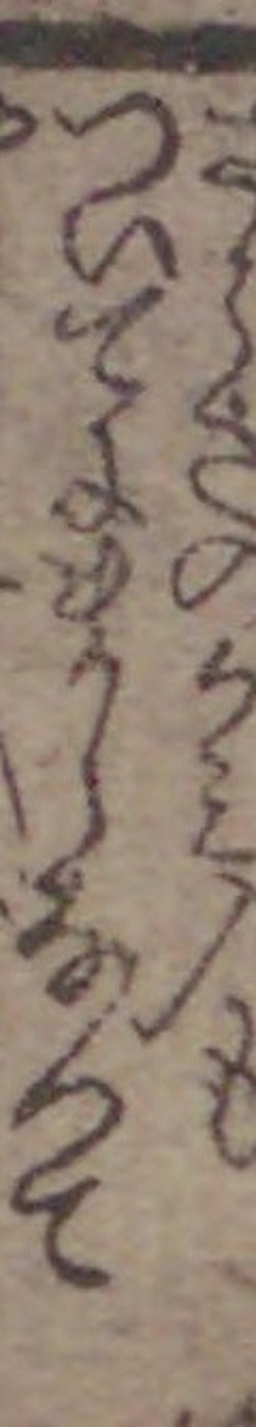ついてにましなつて
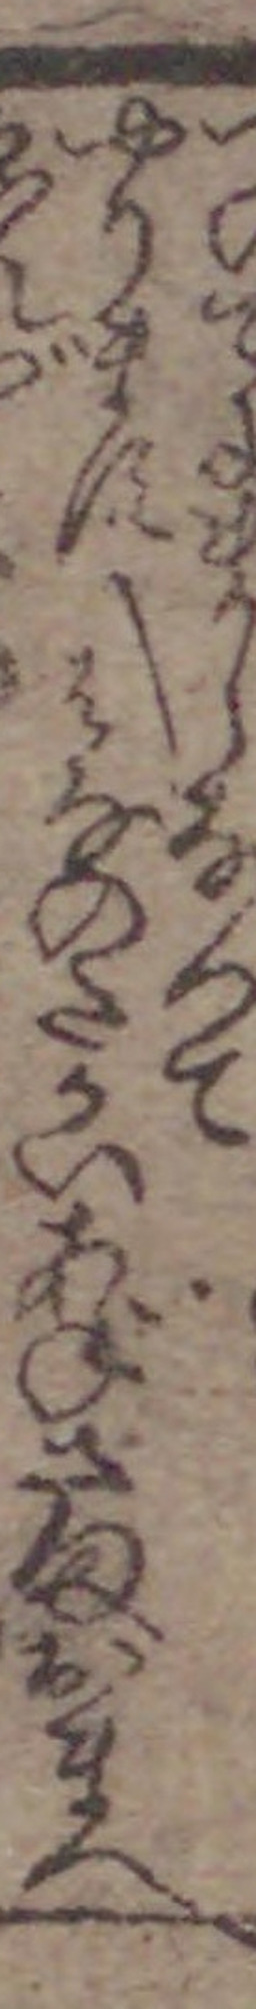やります〽はなのたかいあねさまおまへ
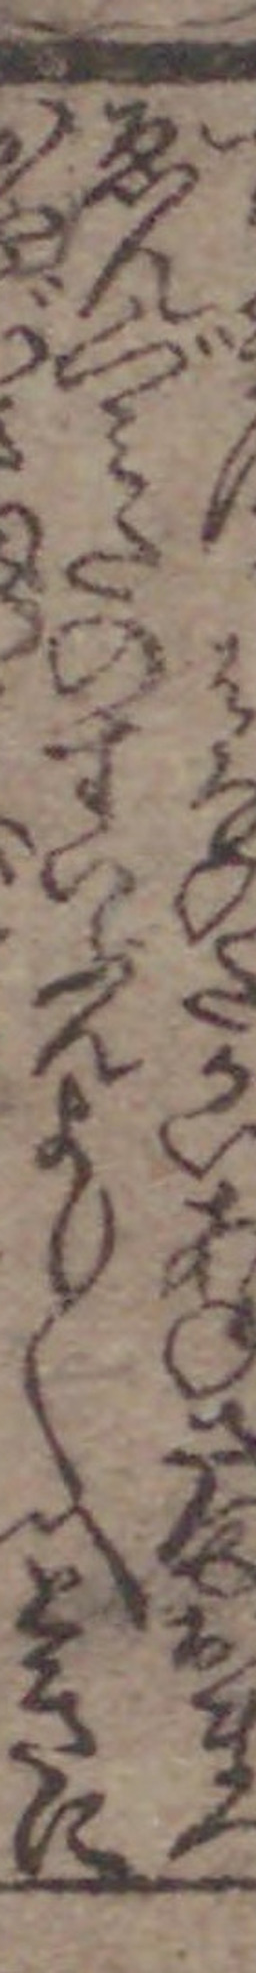ゑんぐみたのすいぶんよし〳〵〽ときに
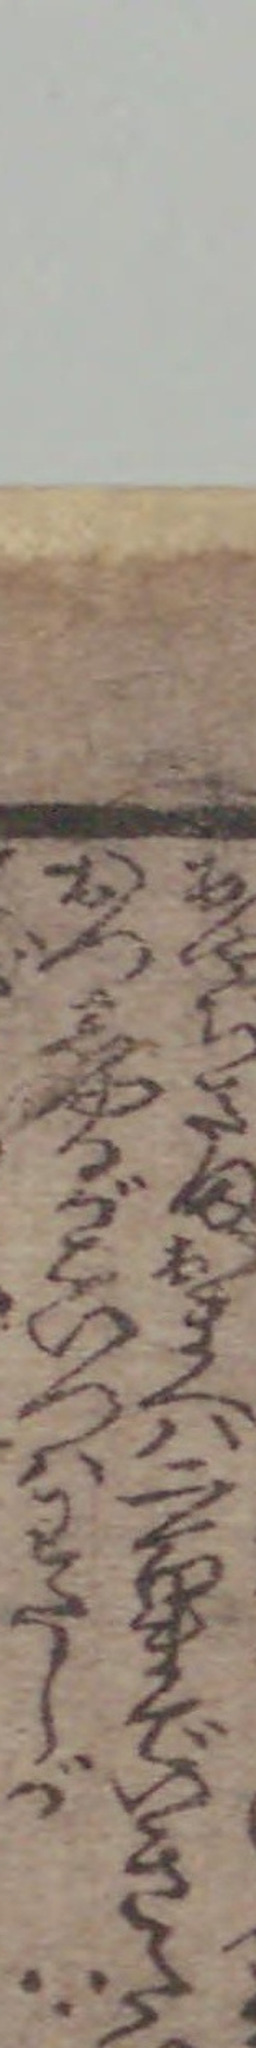おつしやるがこいつはわたしが
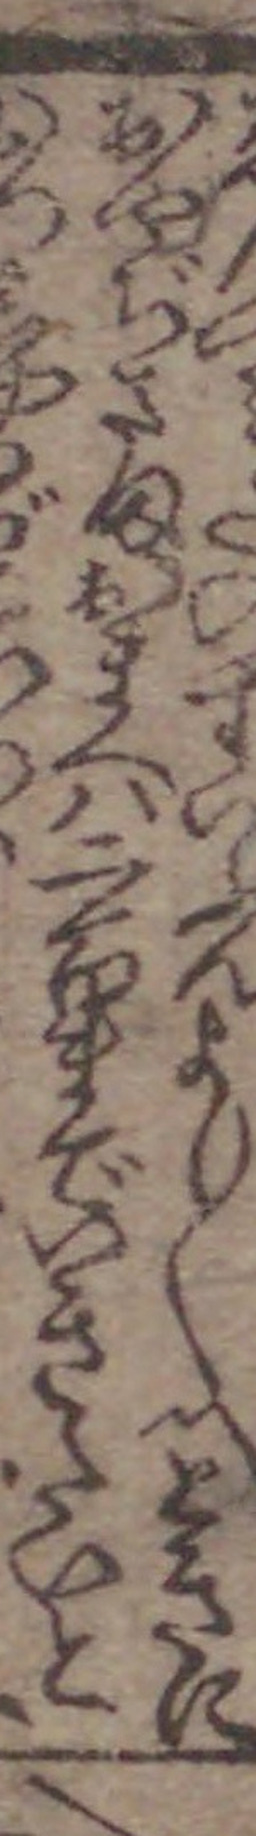おやじさまおまへは二百までいきたいと
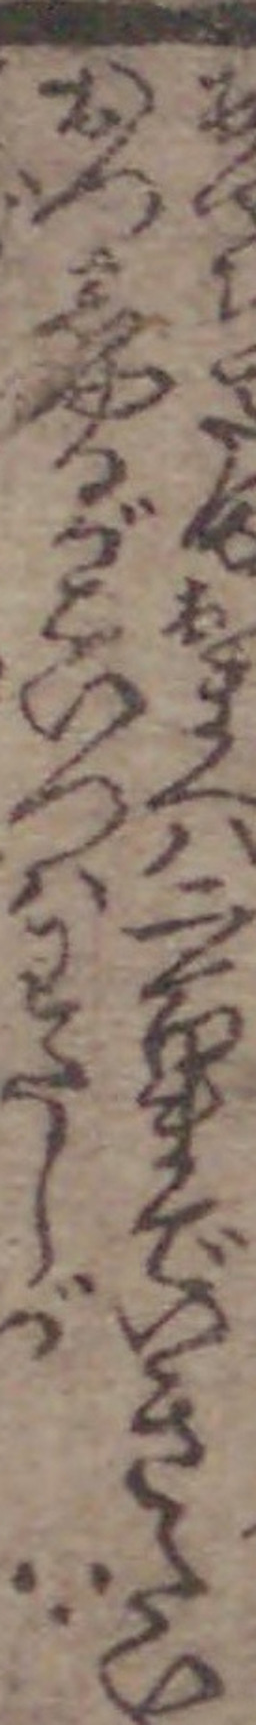おつしやるがこいつはわたしが
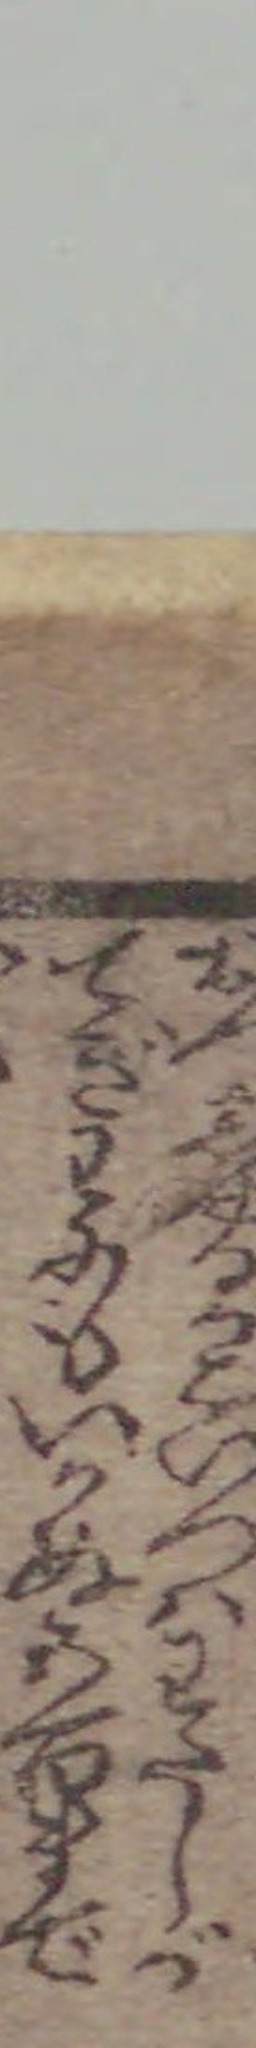てぎわにもいかぬ五百まで
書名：御代の御寶
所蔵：国立国会図書館 National Diet Library, JAPAN
